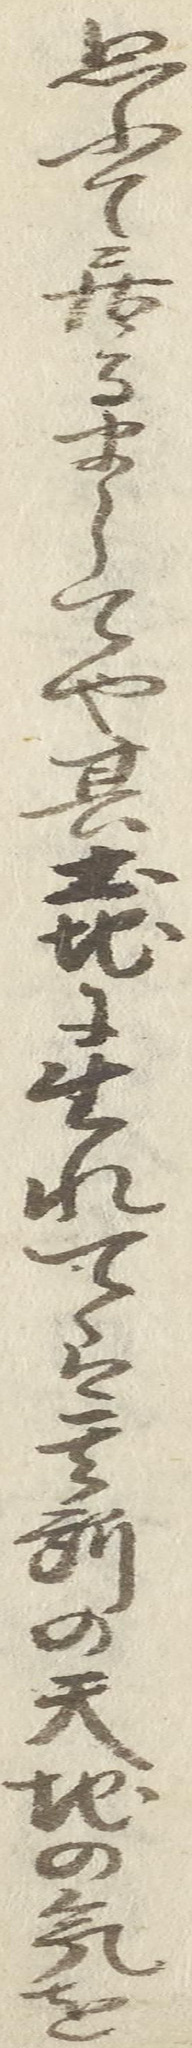思ふて居るましてや其土地に生れては其所の天地の気を
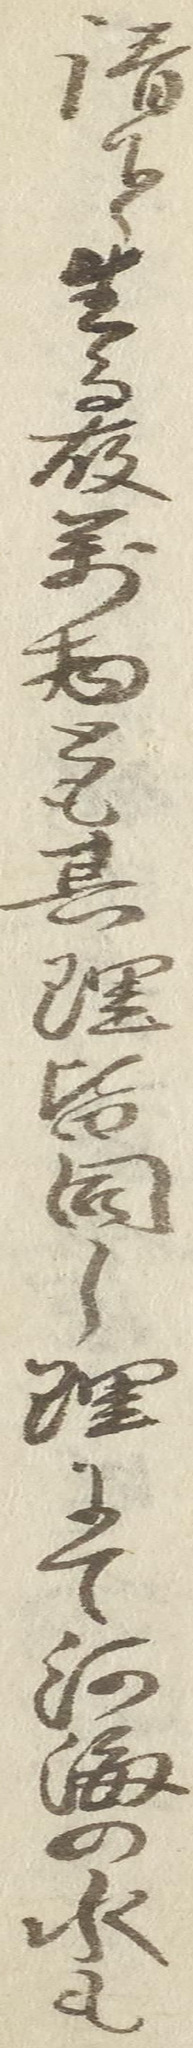請て生る故万物とも其理皆同じ裡にて河海の水も

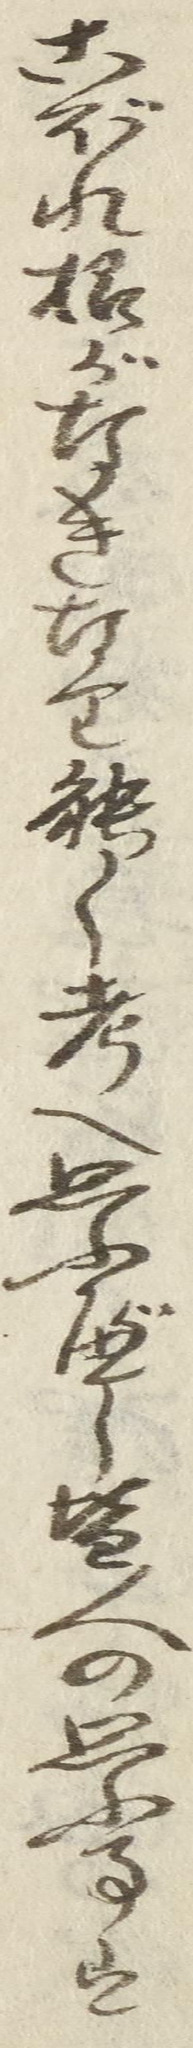こぼれ様がなきなり能く考へ思ふべし皆人の思ふ事は
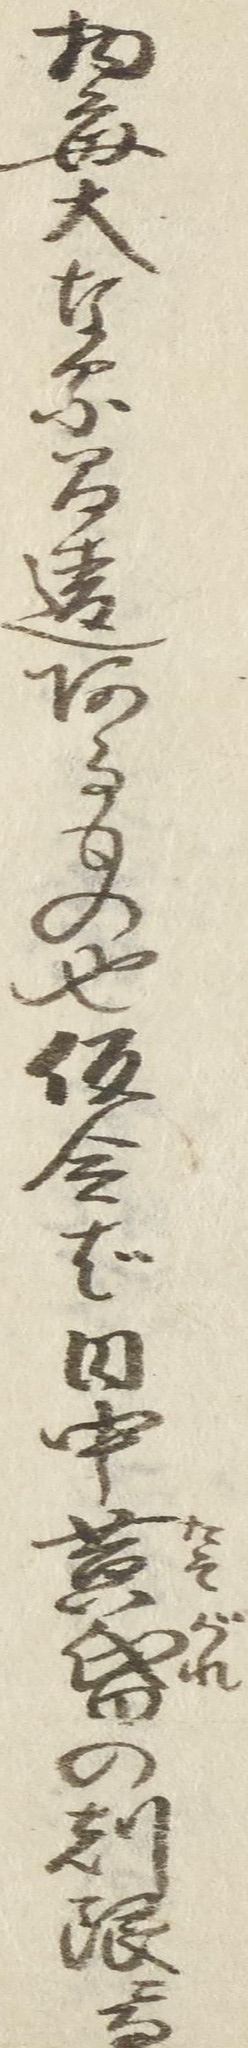物毎大なる間違あるもの也仮令ば日中黄昏の刻限に而
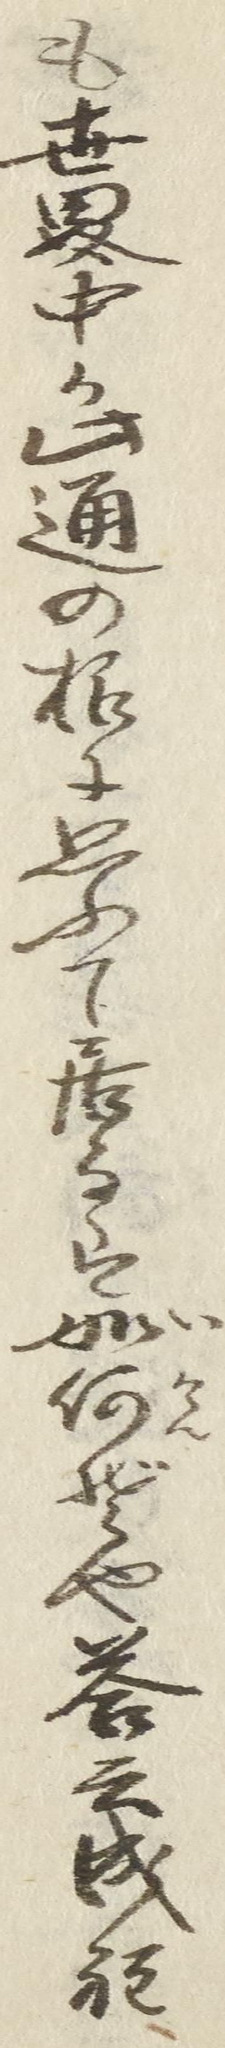も世界中か此通の様子思ふて居るは如何ばらや答云成程
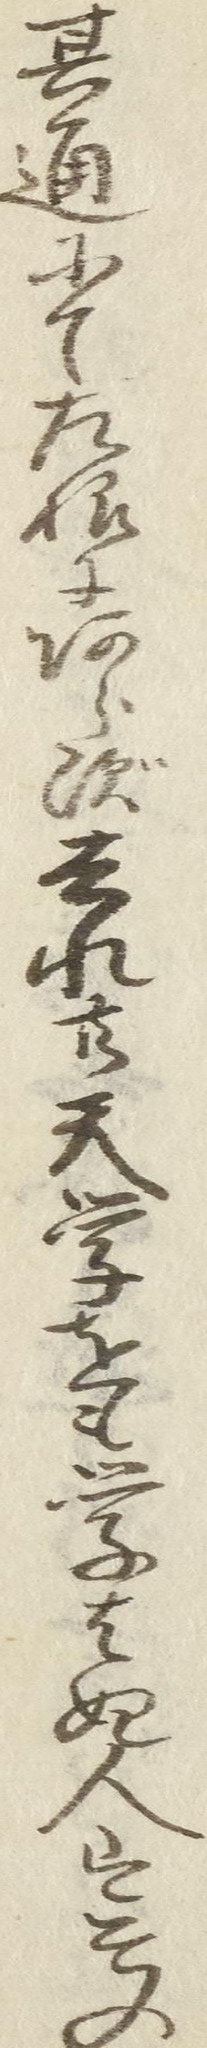其通にて左様にあらず去れ共天学をも学はぬ人はその
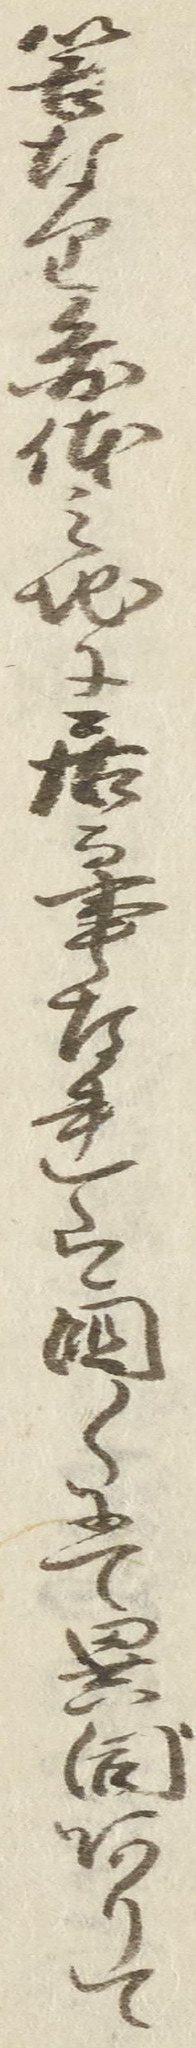筈なり円体の地に居る事なれは周くにて異同ありて
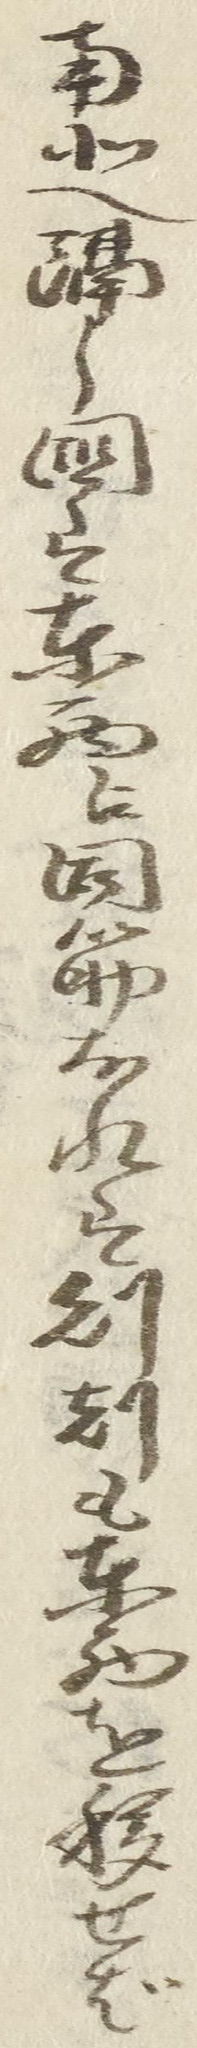南北へ隔し周は東西迄国筋なれは刻刻も東西を移せば
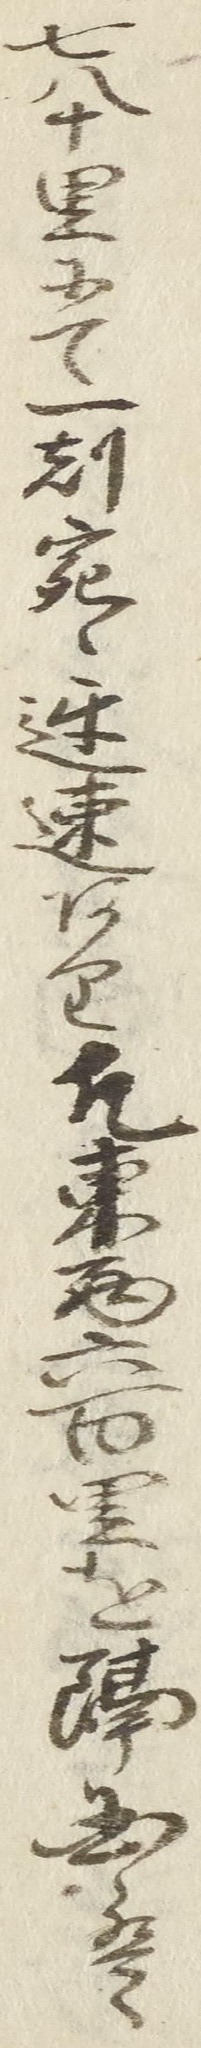七八十里にて一刻宛々迅速なり凡東西六百里を隔国有て
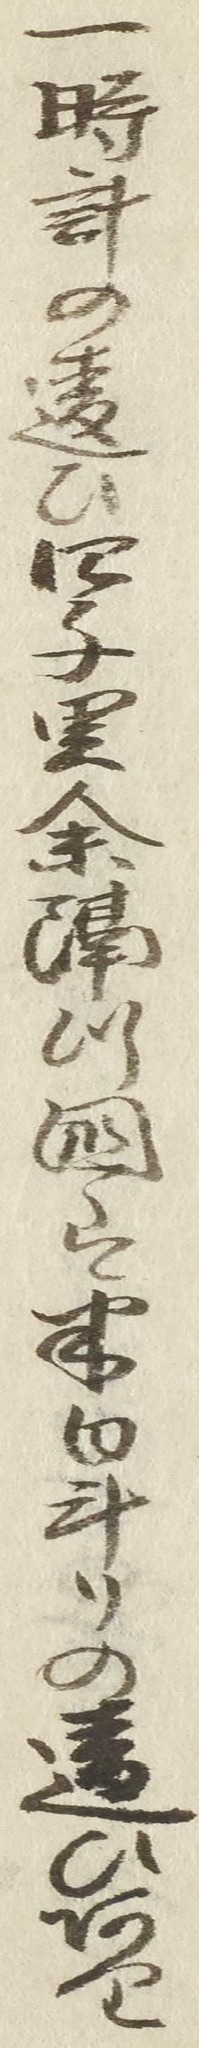一時計の違ひ四千里余隔つ国は半日斗りの違ひあり
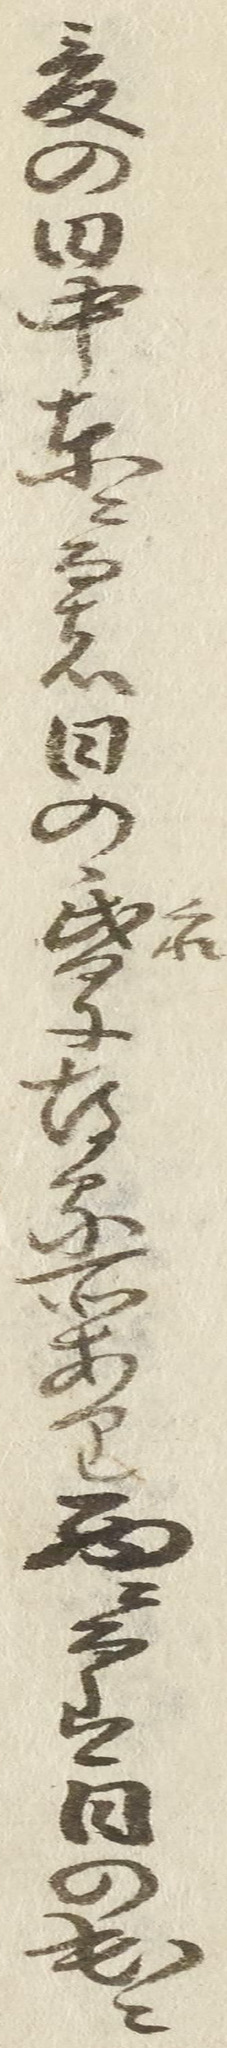夏の日中東に而は日の昏になる所あり西に而は日の出に
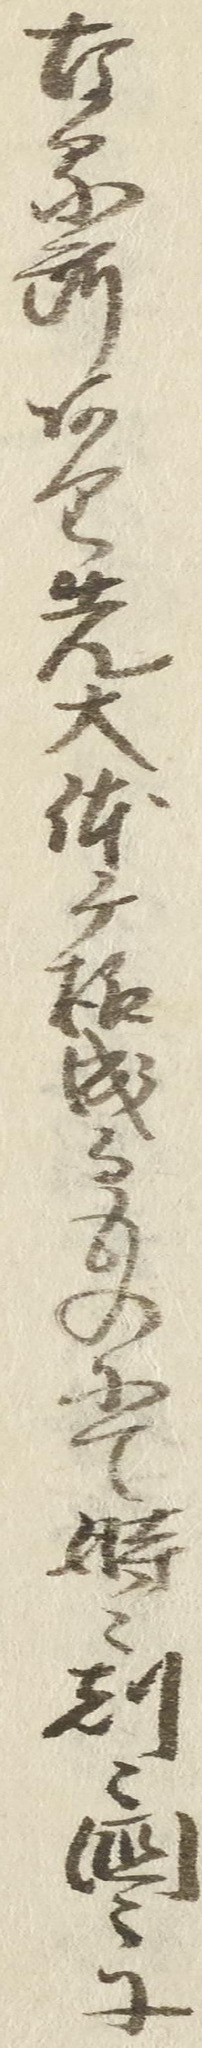なる所あり先大体ヶ様成るものにて時々刻々国々に
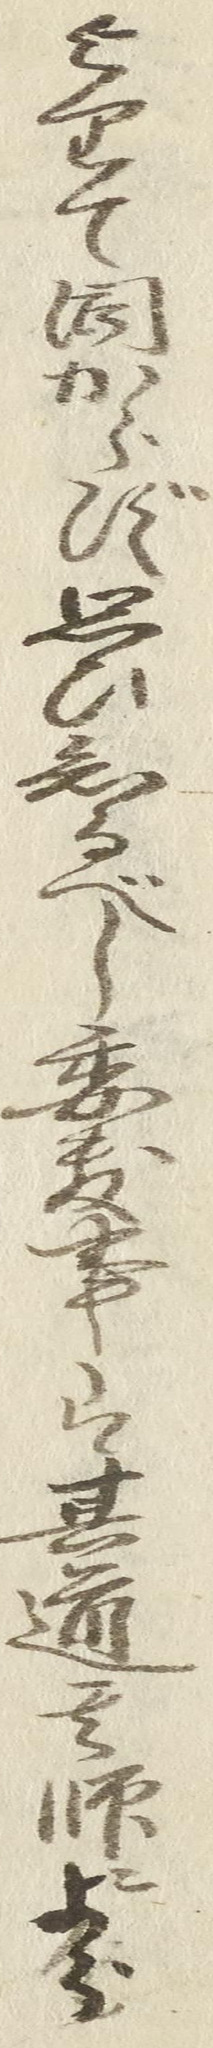よりて同からず思ひ知るべし委敷事は其道其師によら
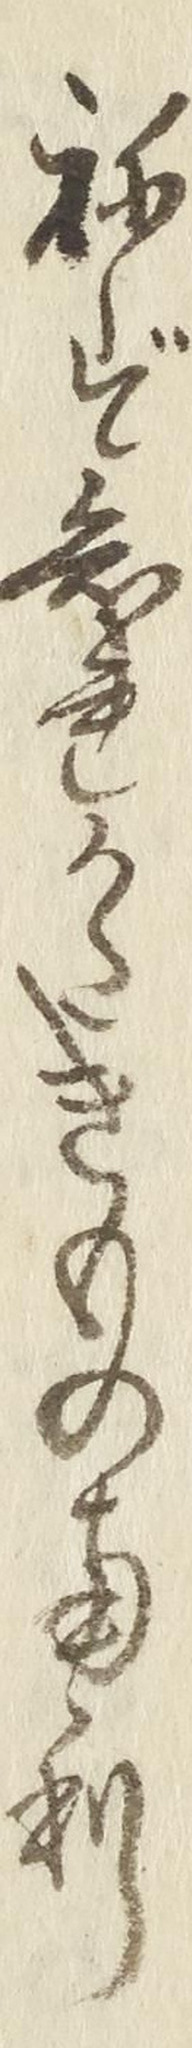ねず知れかたきものなり
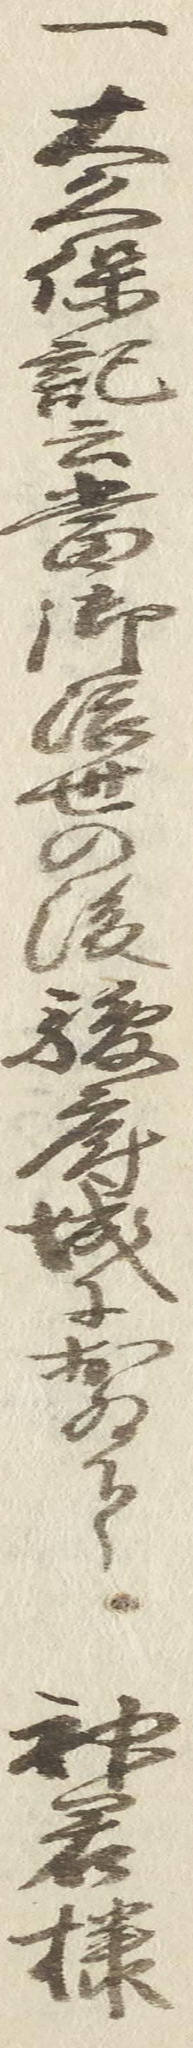一大久保記云当御渡世の後駿府城におゐて神君様
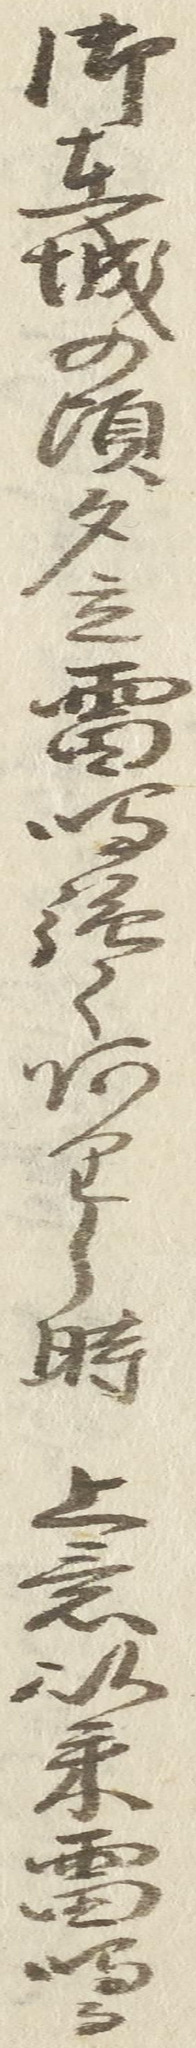御在城の頃夕立雷鳴強くありし時上意以來雷鳴る
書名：従往古地震御届書記誌之一
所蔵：東京大学地震研究所図書室 Earthquake Research Institute Library, The University of Tokyo, JAPAN
